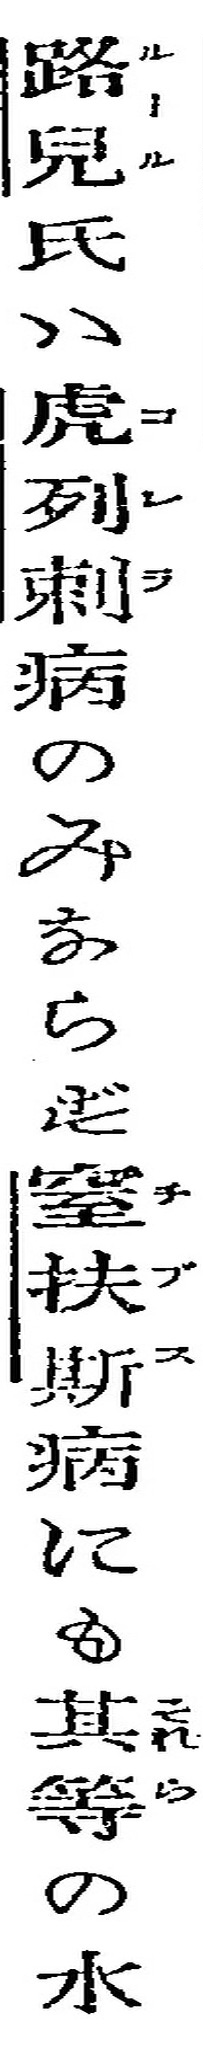路兒氏は虎列刺病のみならず窒扶斯病にも其等の水
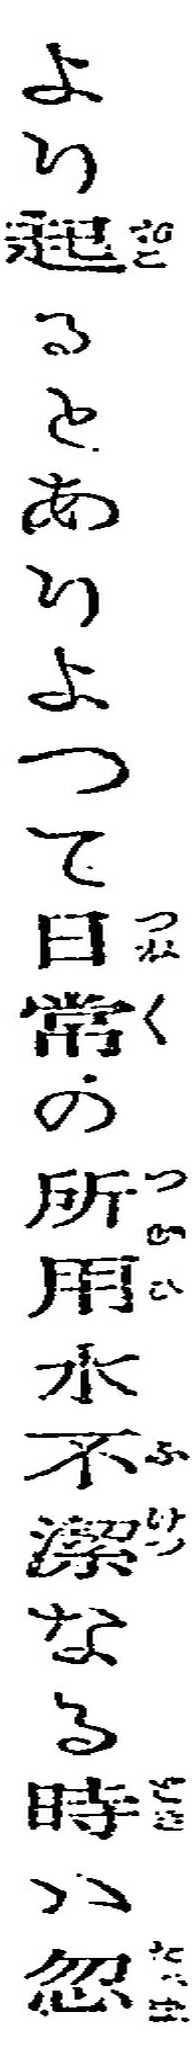より起るとありよつて日常の所用水不潔なる時は忽
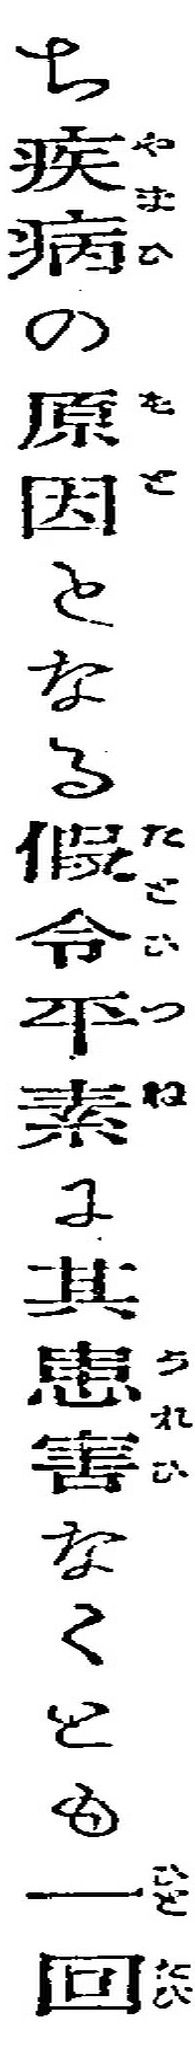ち疾病の原因となる假令平素に其患害なくとも一回
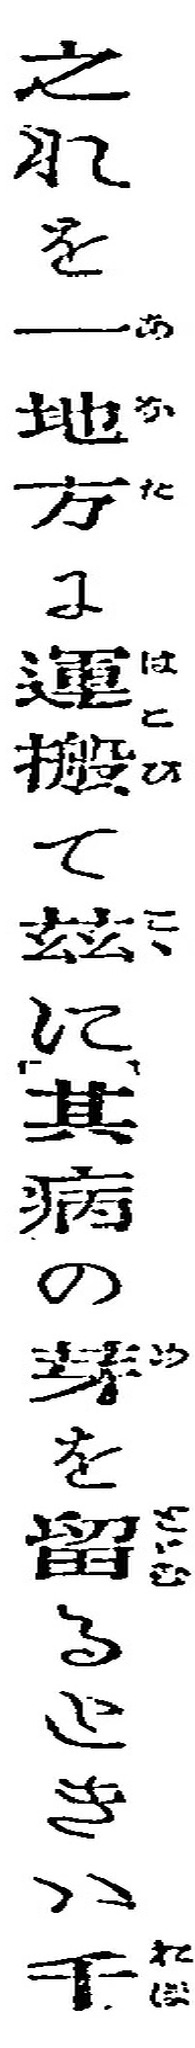之れを一地方に運搬て茲に[其病の芽を留るときは千
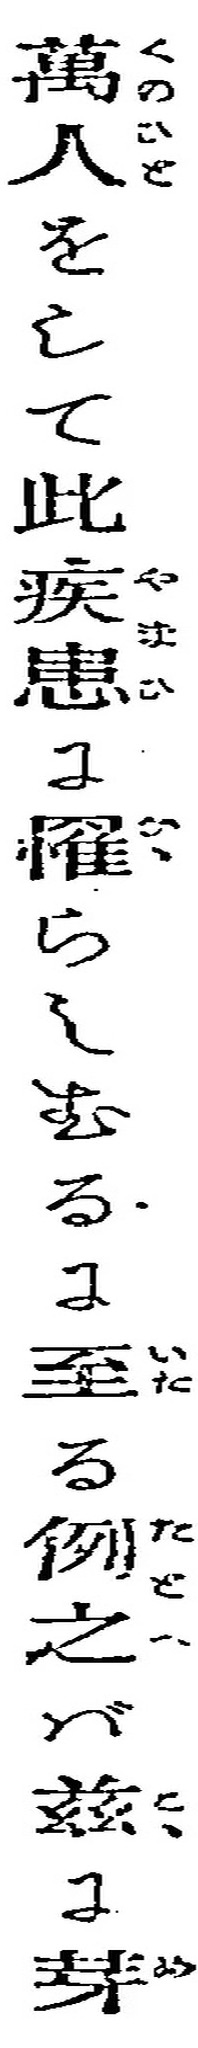萬人をして此疾患に罹らしむるに至る例之ば茲に芽
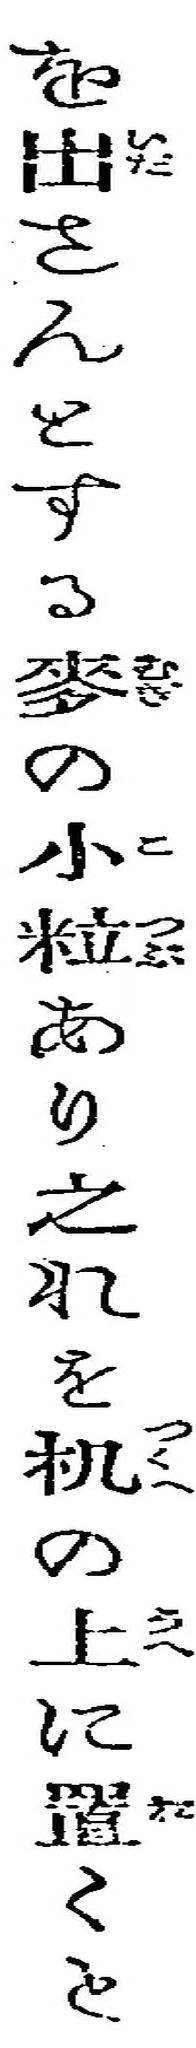を出るさんとする麥の小粒あり之れを机の上におくくと
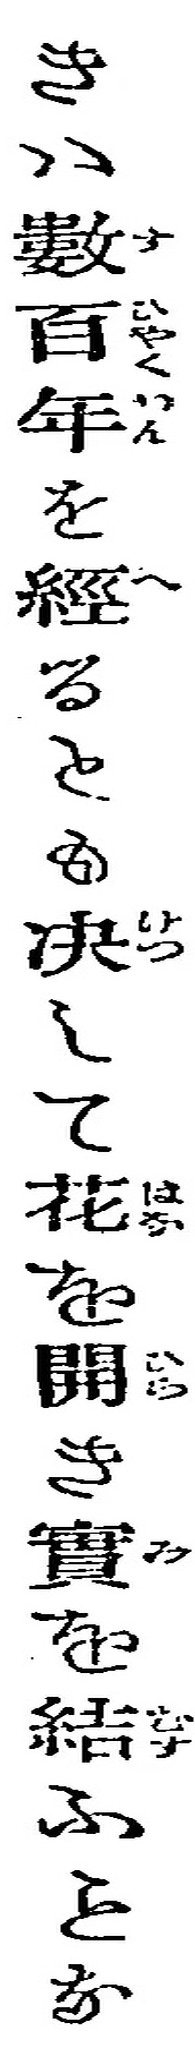きは数百年を経るとも決して花を開き實を結ふことな

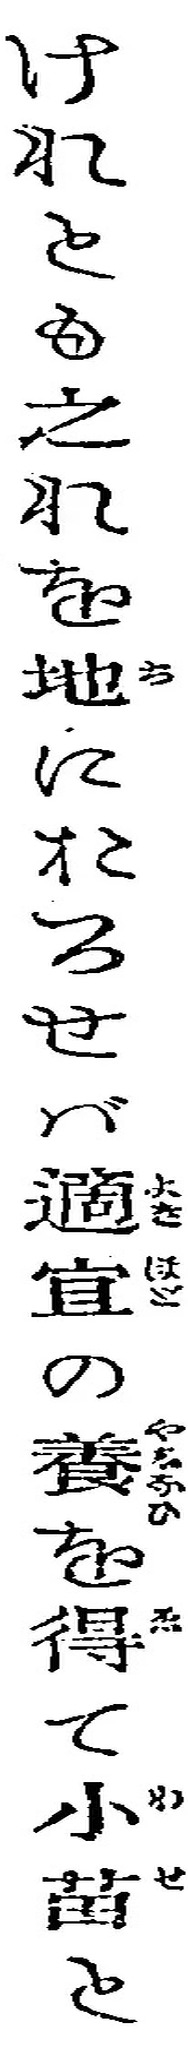けれとも之れを地におろせば適宜の養を得て小苗と
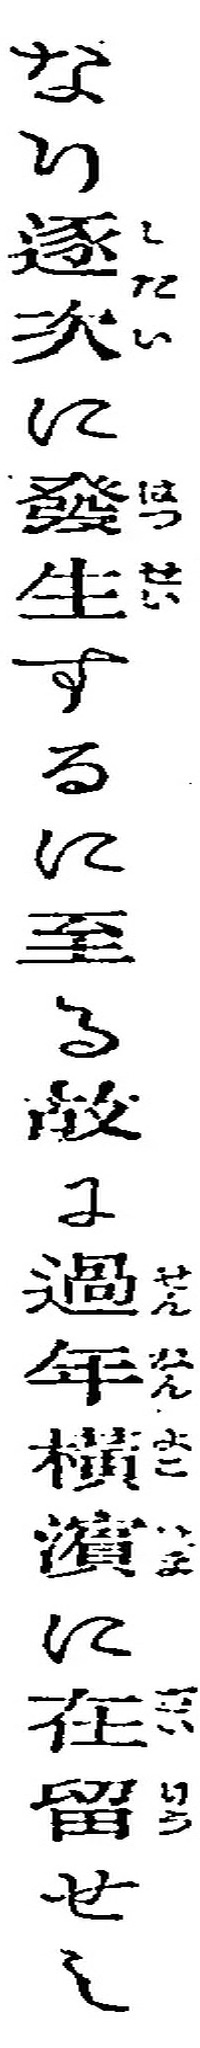なり逐次に発生するに至る故に過年横濱に在留せし
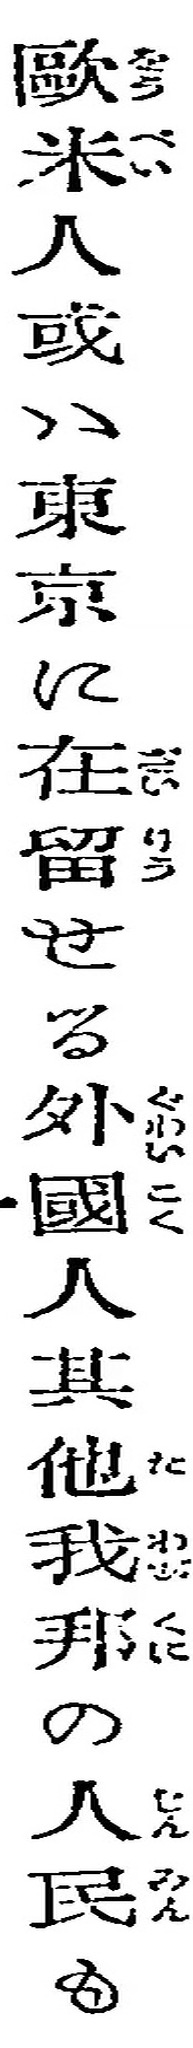欧米人或は東京に在留せる外国人其他我邦の人民も
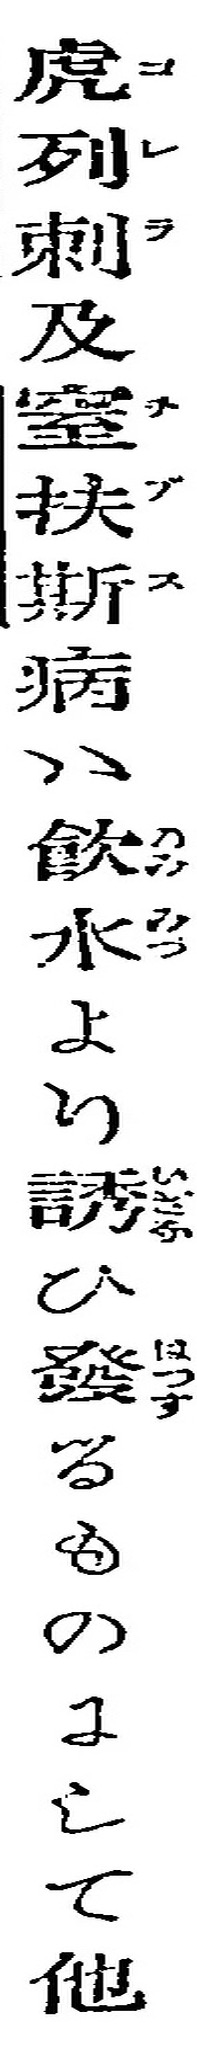虎列刺及窒扶斯病は飲水より誘ひ發るものにして他
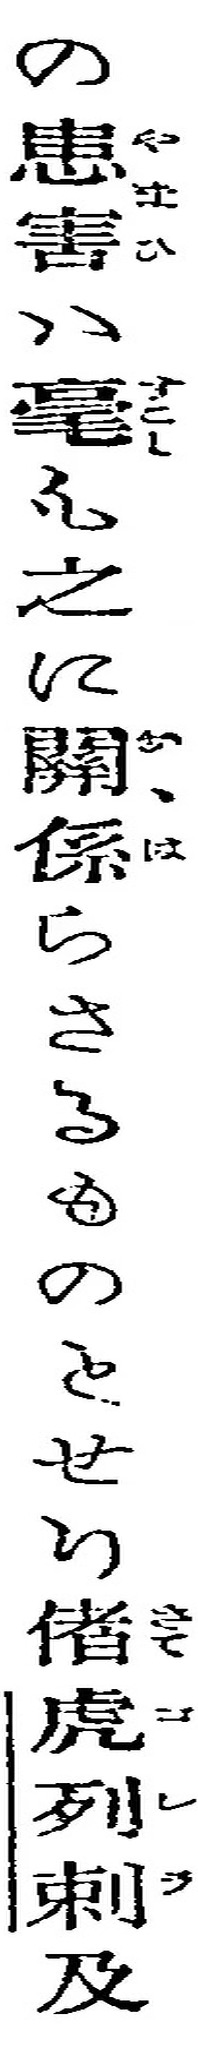の患害は毫も之に関係らさるものとせり偖虎列刺及
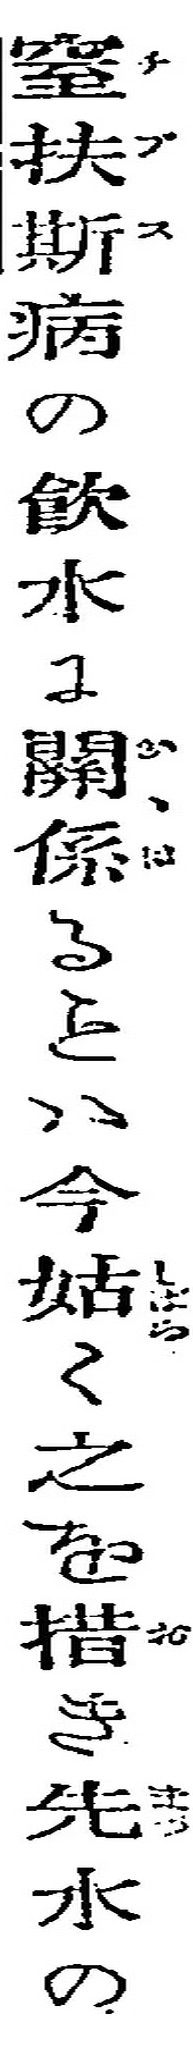窒扶斯病の飲水に関係ることは今姑く之を措き先水の
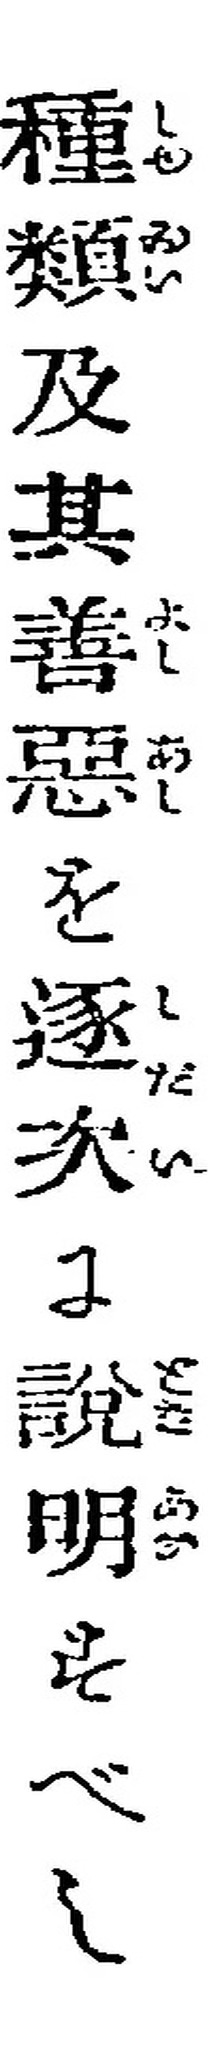種類及其善悪を逐次に説明すべし
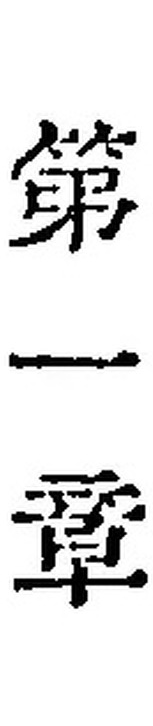第一章
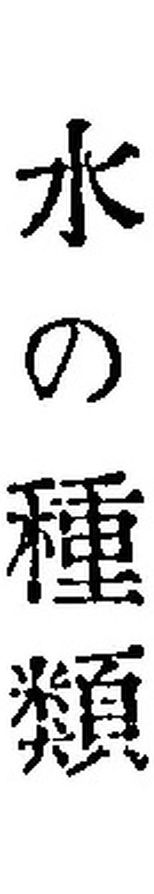水の種類
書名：飲水の心得 : 伝染病の予防
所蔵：国立国会図書館 National Diet Library, JAPAN
